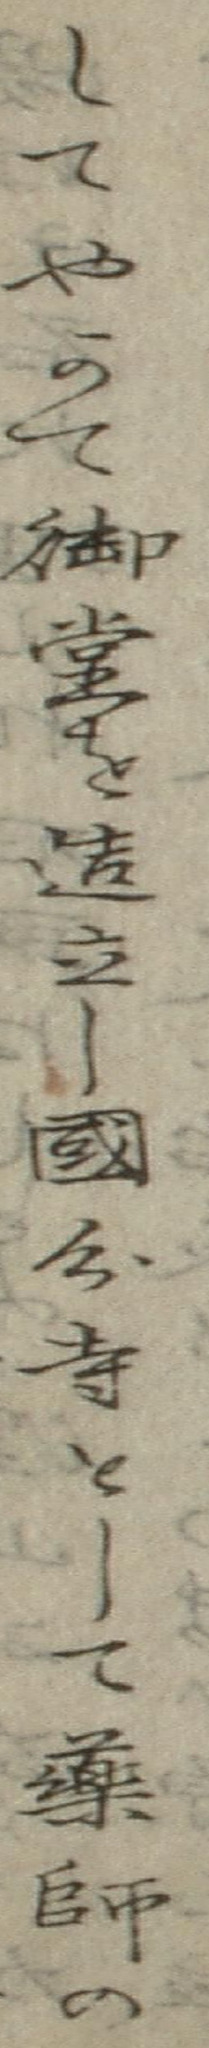してやかて御堂を造立し国分寺として薬師の
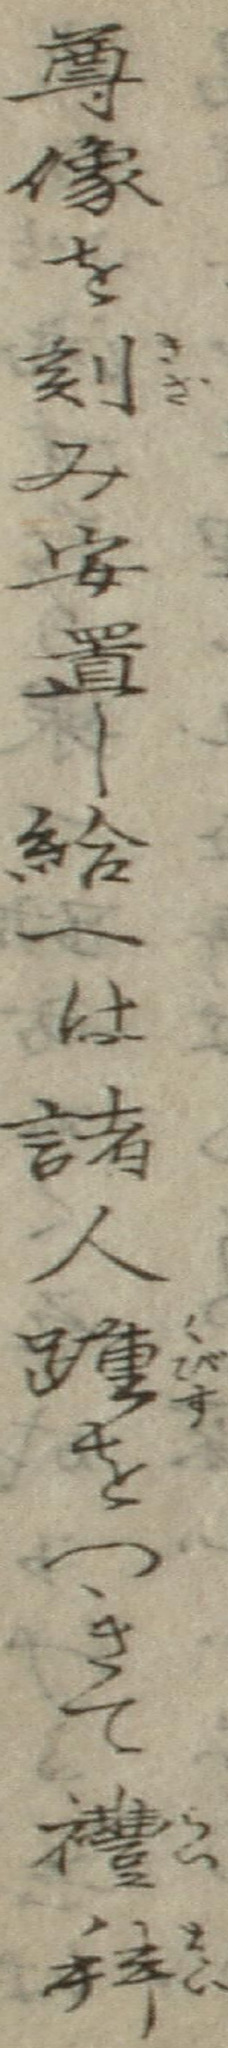尊像を刻み安置し給へは諸人踵をつきて礼拝
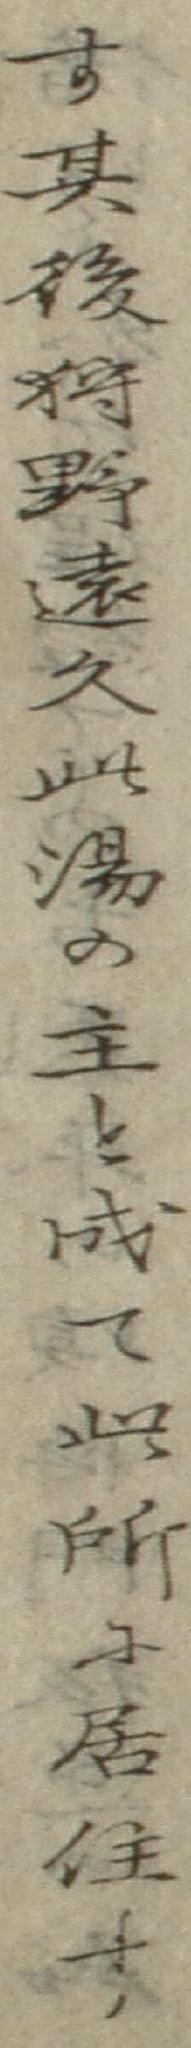す其後狩野遠久此湯の主と成て此所に居住す

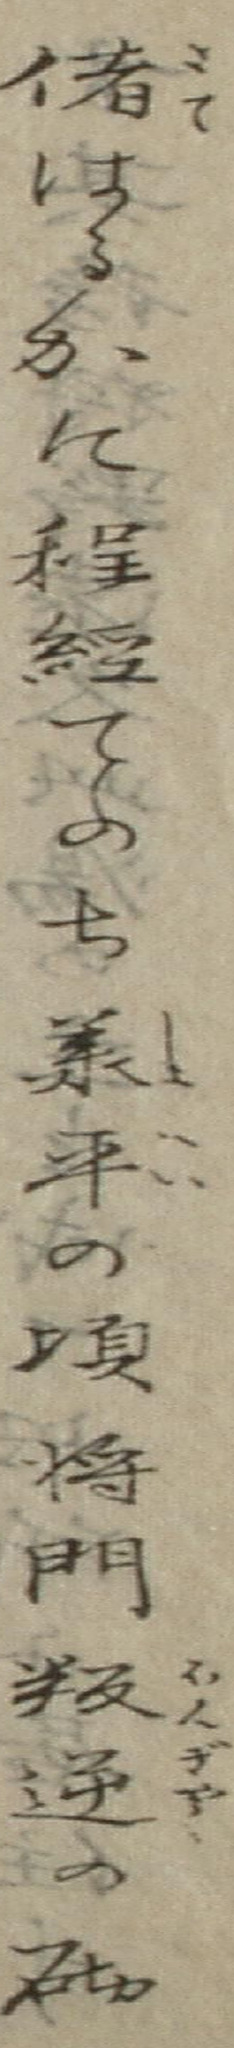偖はるかた程経てのち承平の頃将門叛逆の
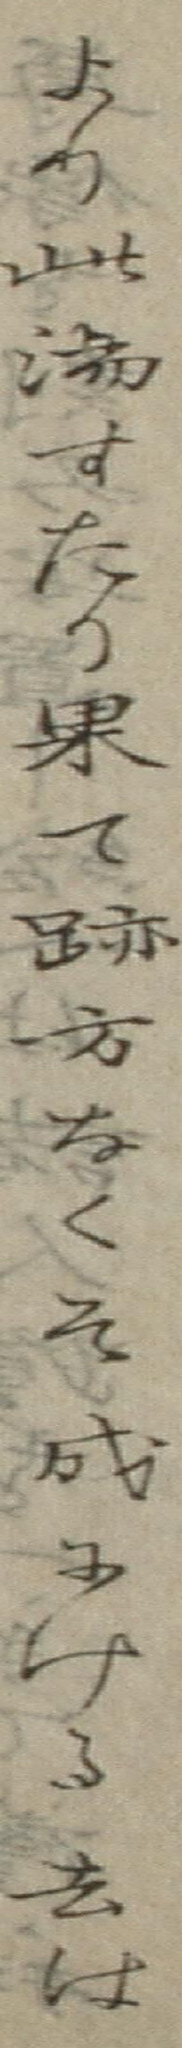砌より此湯すたり果て跡方なくそ成にける去は
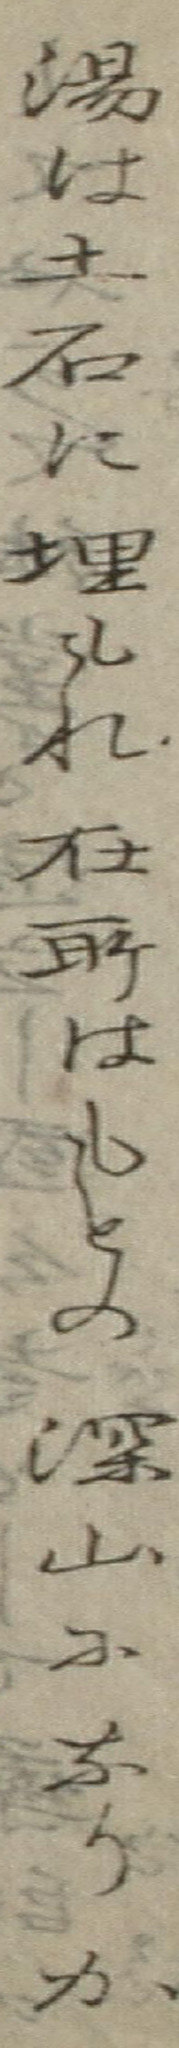湯は土石に埋もれ在所はもとの深山になりか
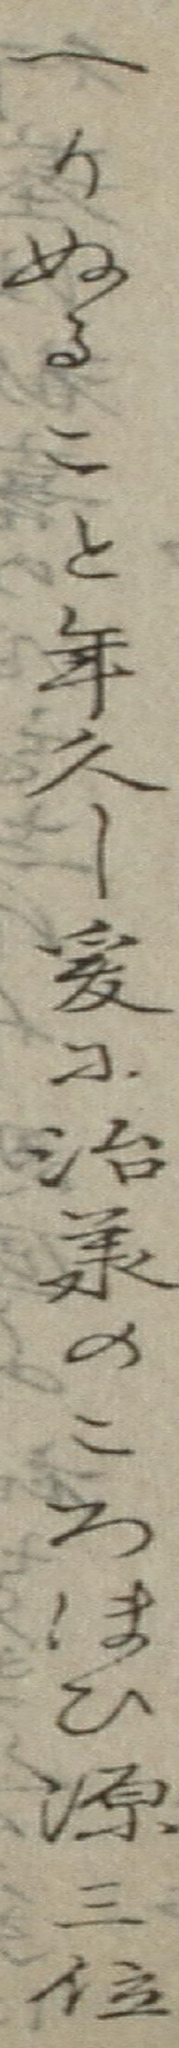へりぬること年久し爰に治承のころほひ源三位
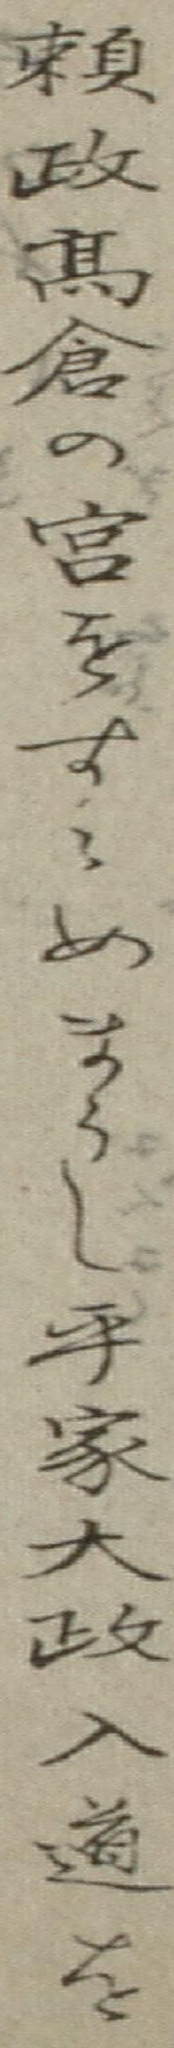頼政高倉の宮をすゝめまうし平家大政入道を
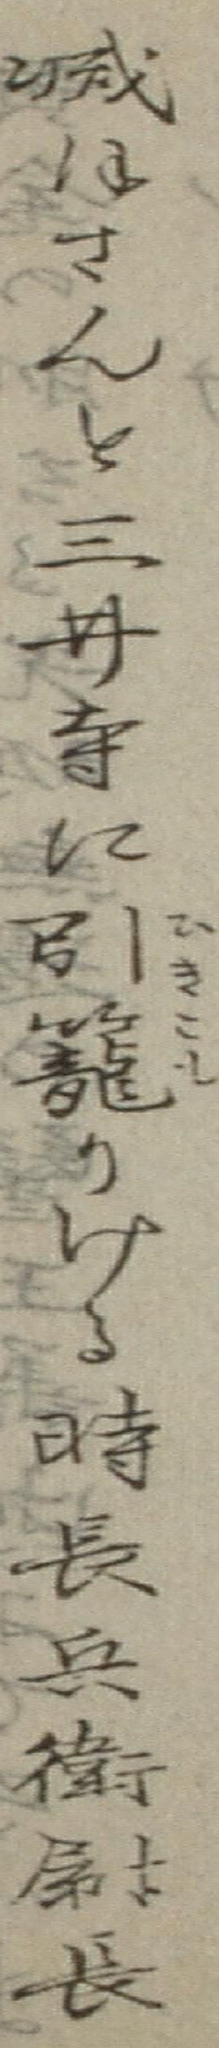滅ほさんと三井寺に引籠りける時長兵衛尉長
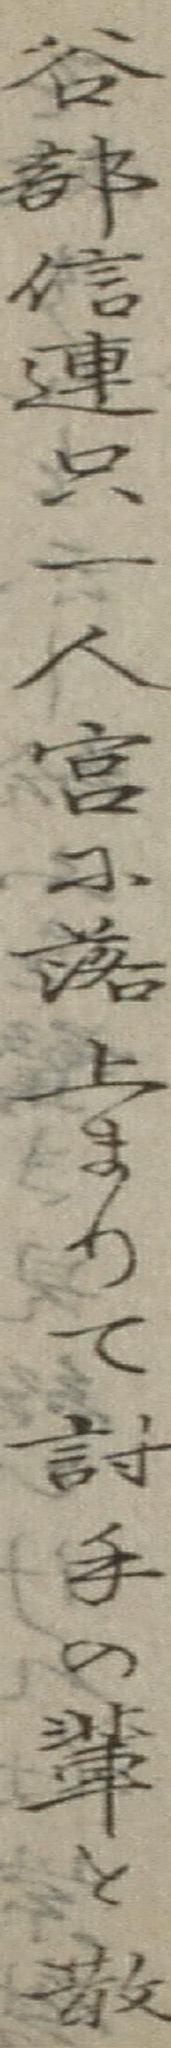谷部信連只一人宮に落上まりて討手の輩と散
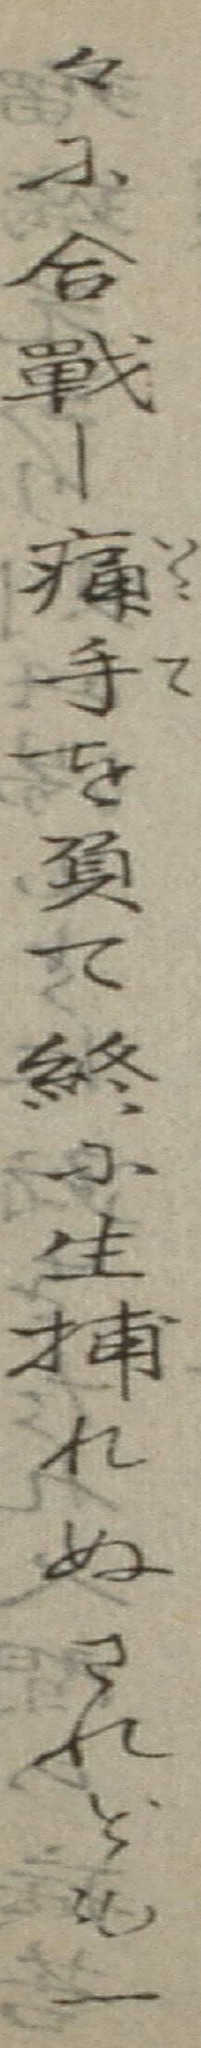々に合戦し痛手を負て終に生捕れぬされども一
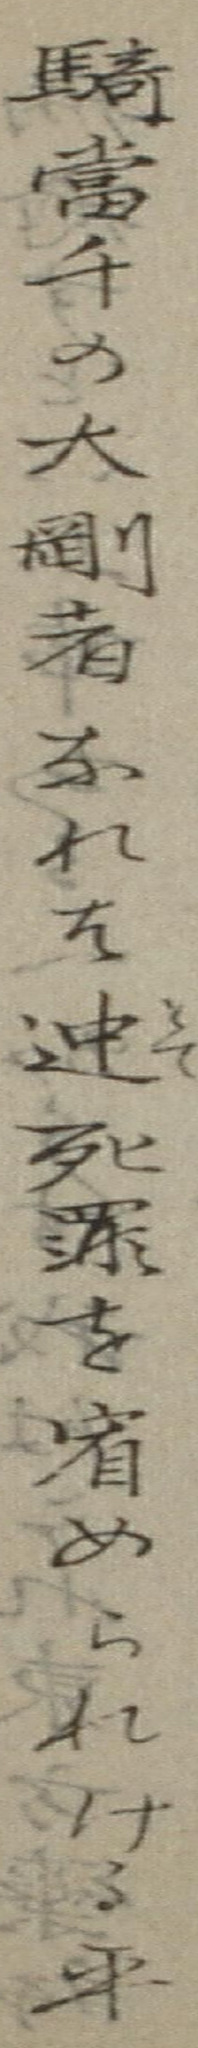騎当千の大剛者なれは迚死罪を宥められける平
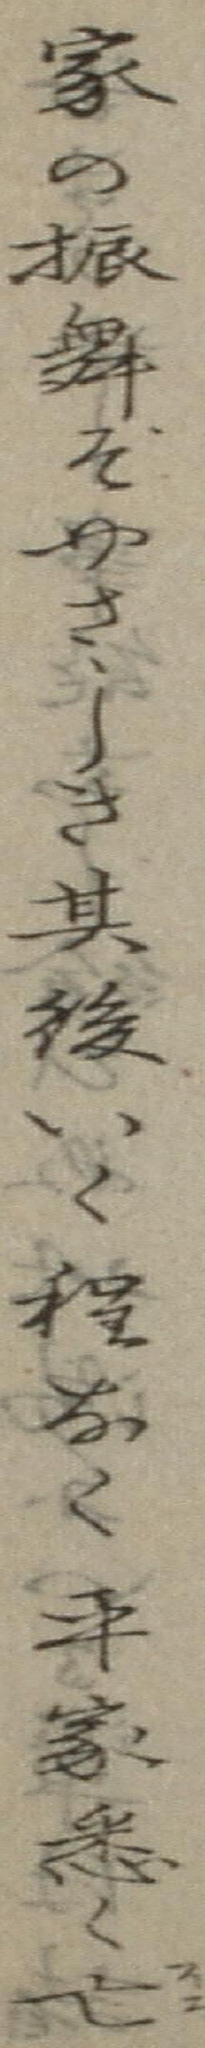家の振舞ぞやさしき其後いく程なく平家悉く亡
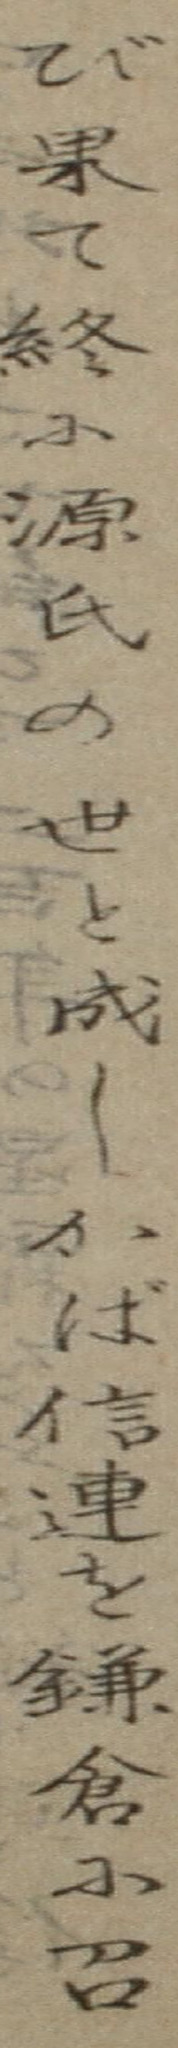び果て終に源氏の世と成しかば信連を鎌倉に召
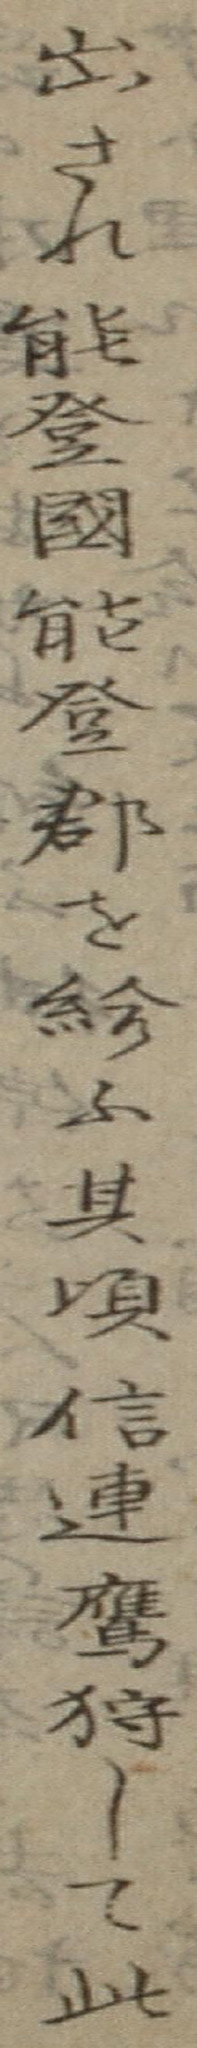出され能登国能登郡を給ふ其頃信連鷹狩して此
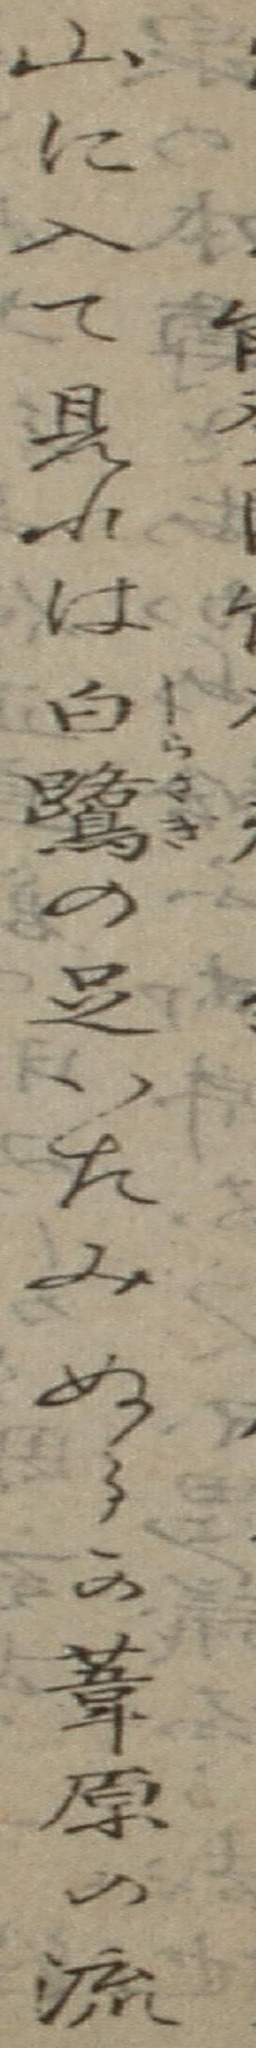山に入てみれは白鷺の足いたみぬるか葦原の流
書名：山中温泉縁記并ニ入浴之心得
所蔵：東京大学地震研究所図書室 Earthquake Research Institute Library, The University of Tokyo, JAPAN
